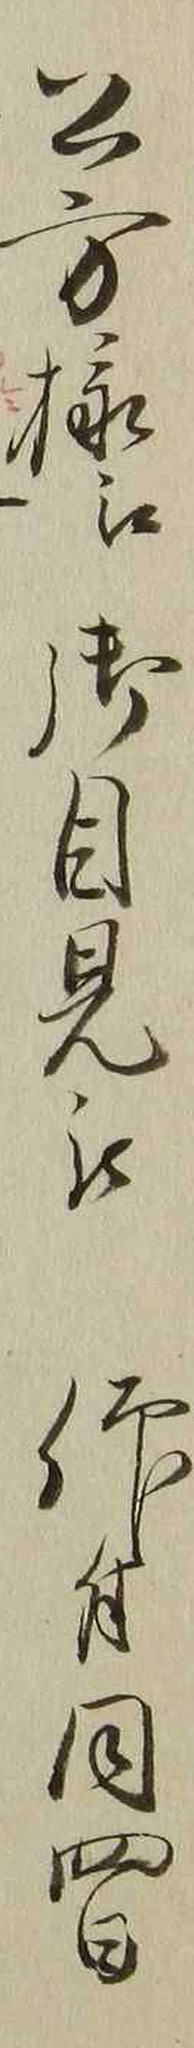公方様江御目見被仰付同四日
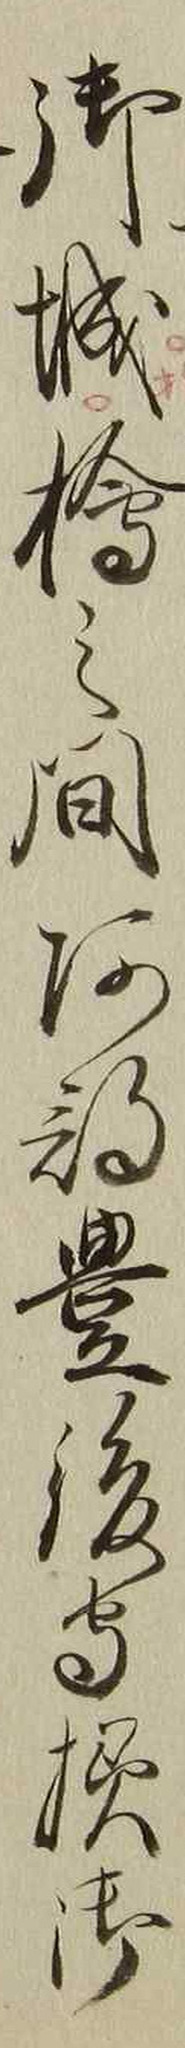御城桧之間阿部豊後守様御
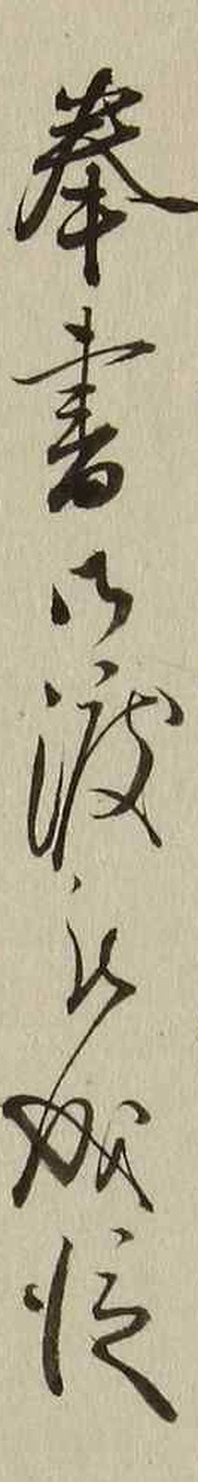奉書御渡被成従
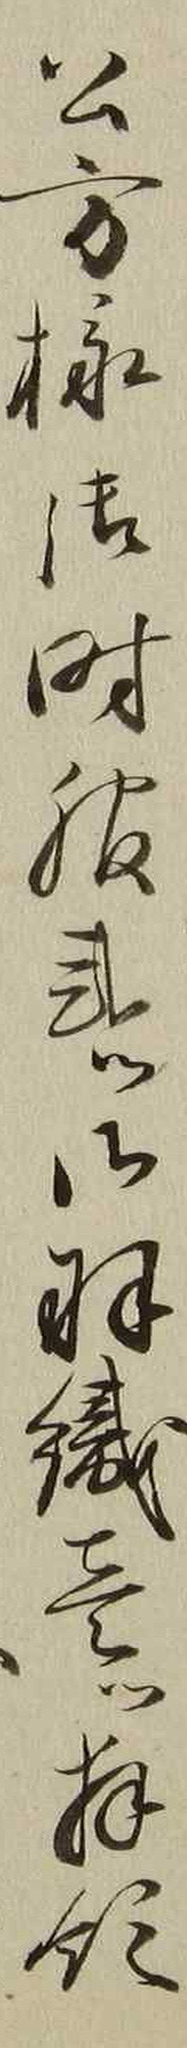公方様御時服弐つ御羽織壱つ拝領
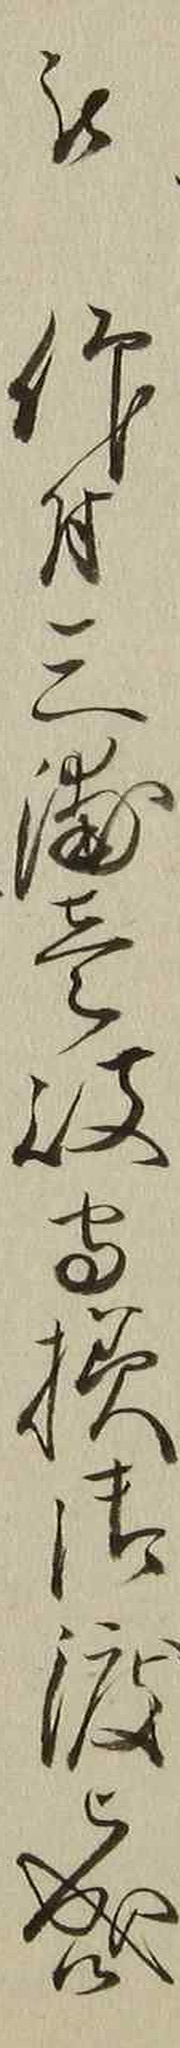被仰付三浦壱岐守様御渡被成候
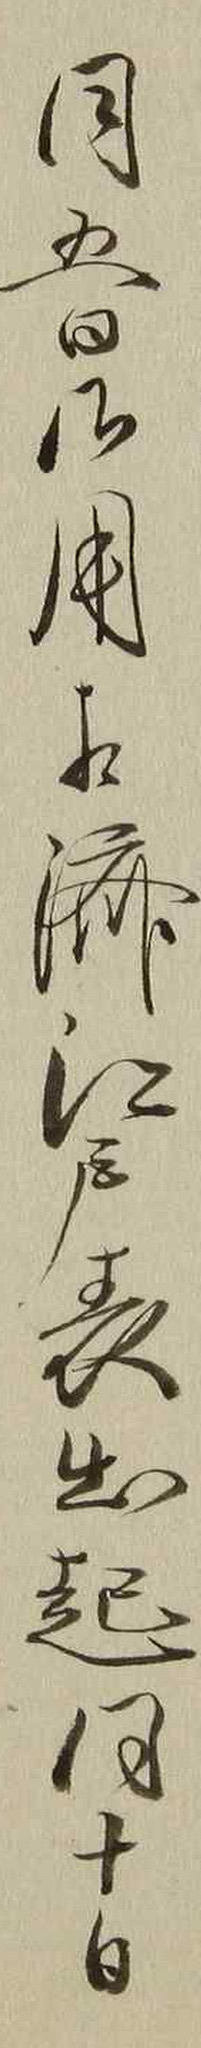同五日御用相済江戸表出起同十日
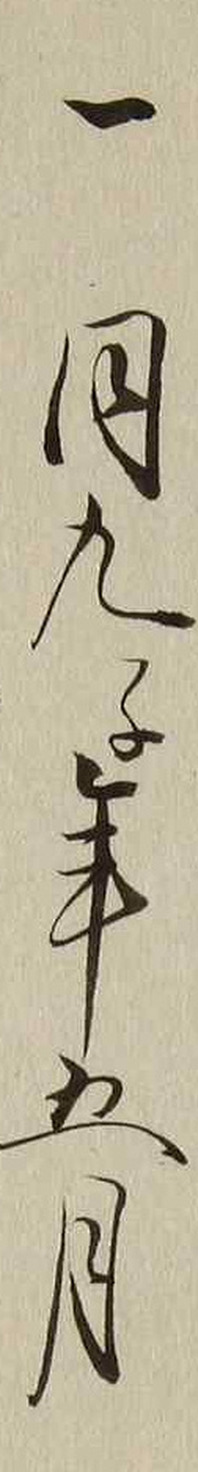一同九子年五月
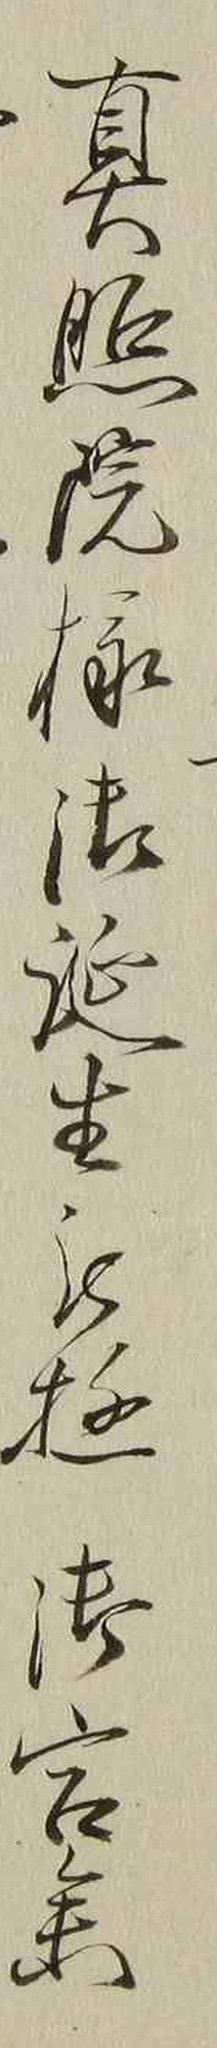真照院様御誕生被遊御宮参
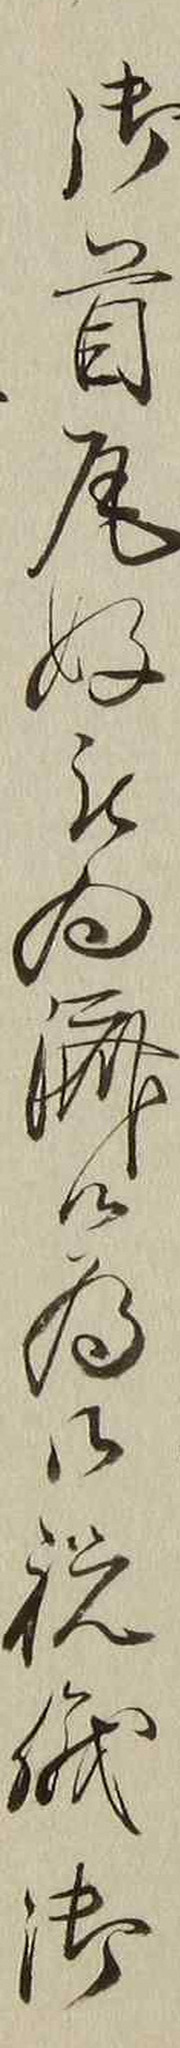御首尾好被為済候為御祝儀御
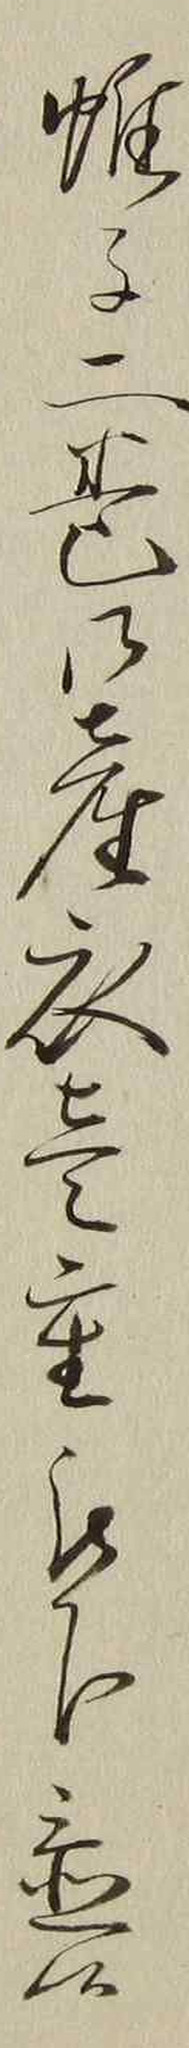帷子二巻御産衣壱重被下置候
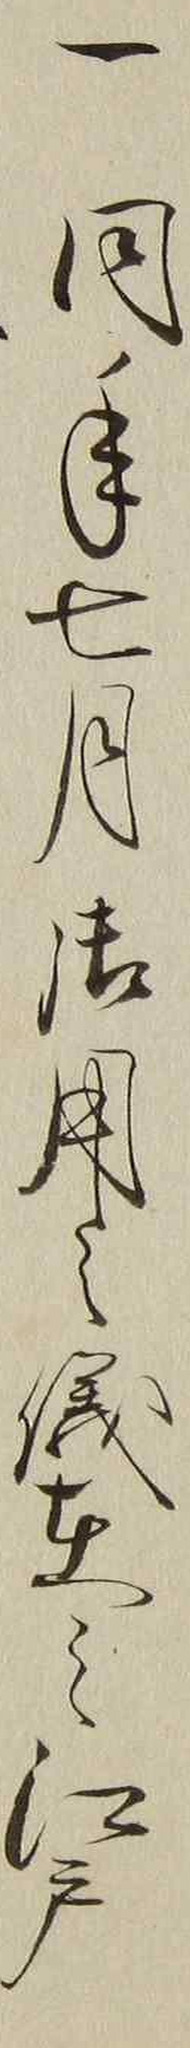一同年七月御用之儀在之江戸
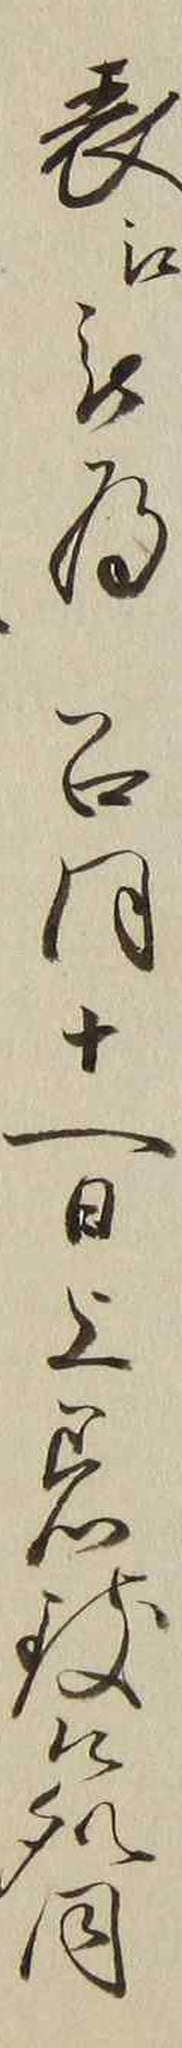表江被為召同十一日上着致候処
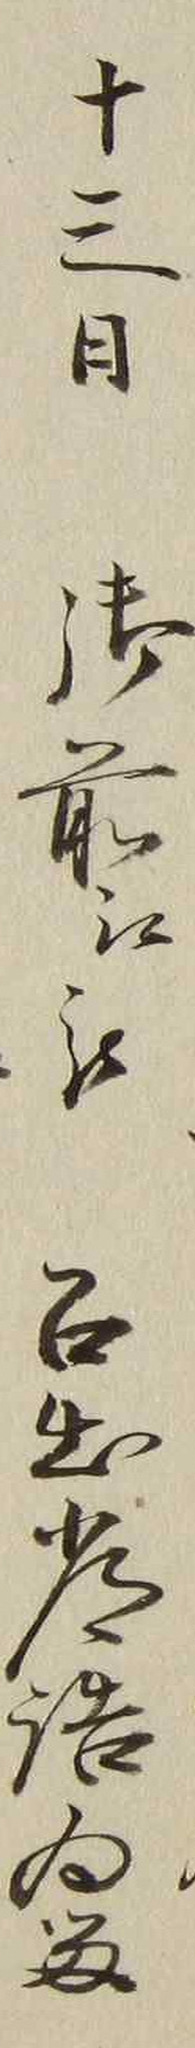十三日御前江被召出常詰為留
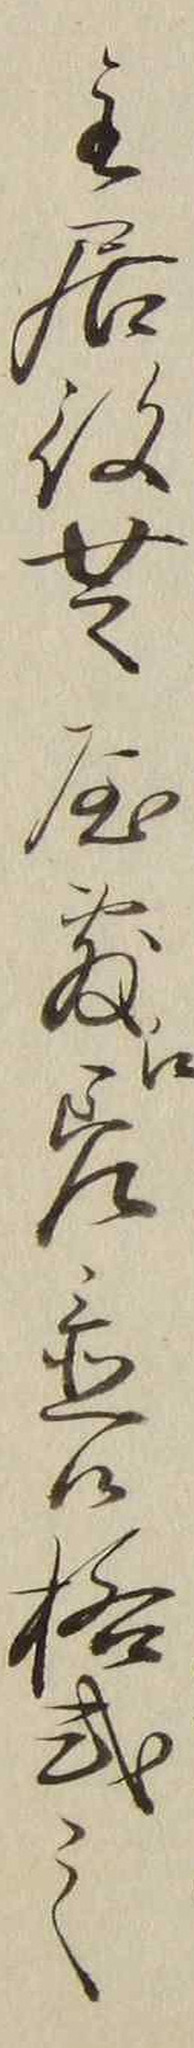主居役芝屋敷江差置候格式之

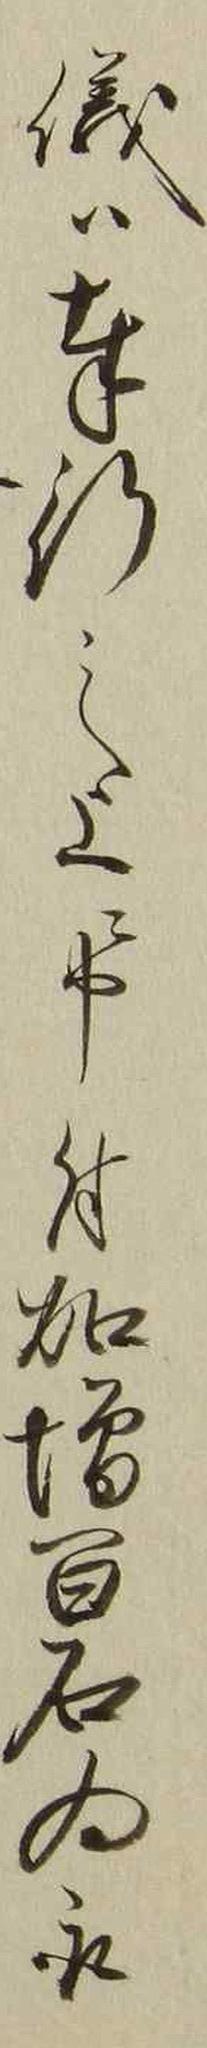儀は奉行之上に申付加増百石為被
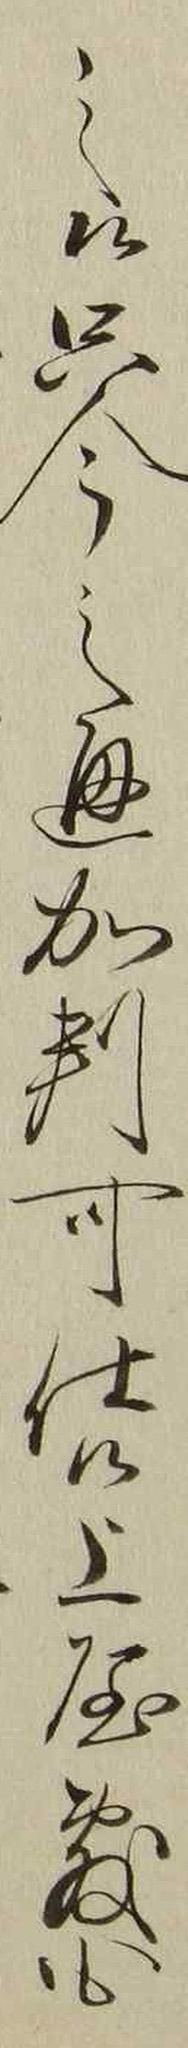之候只今之通加判可仕侯上屋敷へも
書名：諸士系譜　巻之103　か之部11
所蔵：会津若松市立会津図書館
